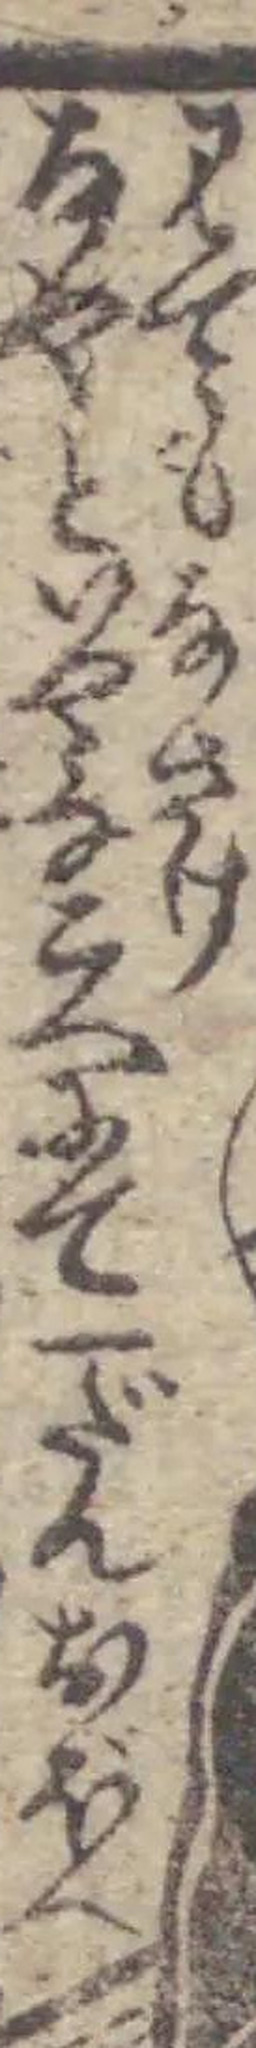なやといやなこへにて一だんおぼへ
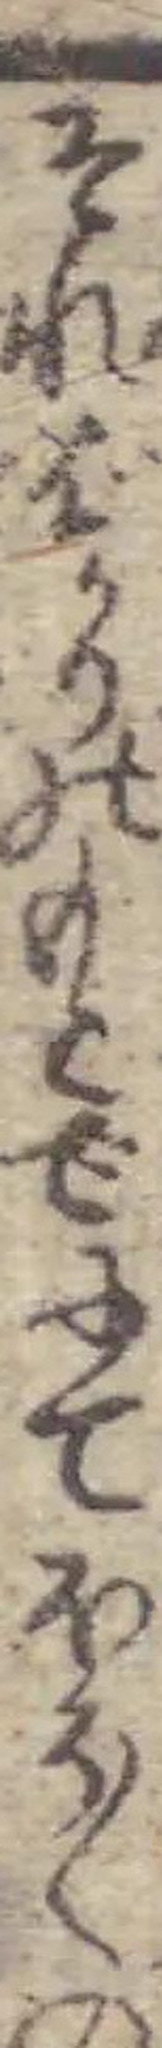そればかりのもとでにてほう〳〵の
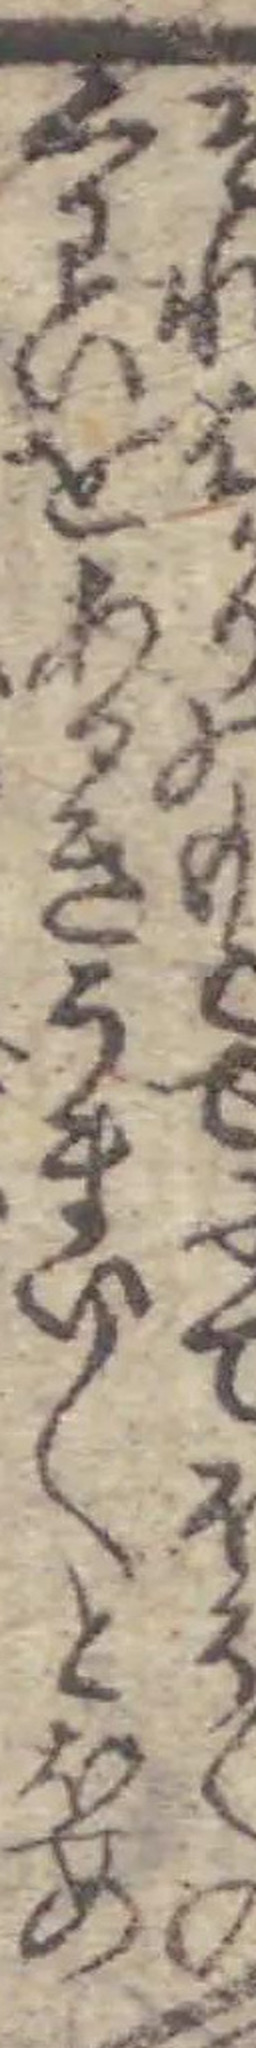くわいをあるきうまい〳〵とほめ
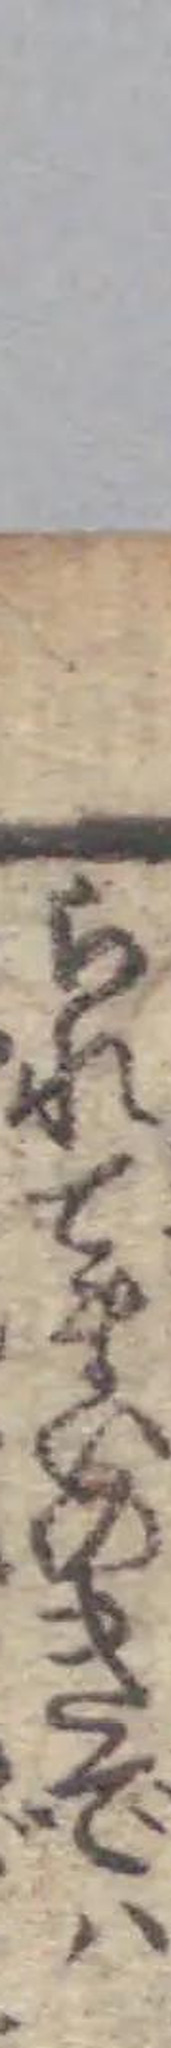られてまいのきでは
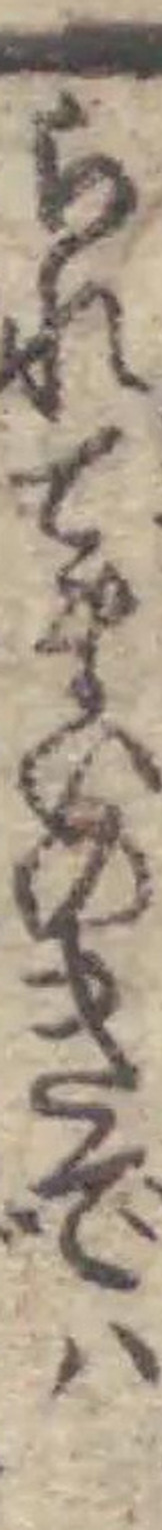られてまいのきでは
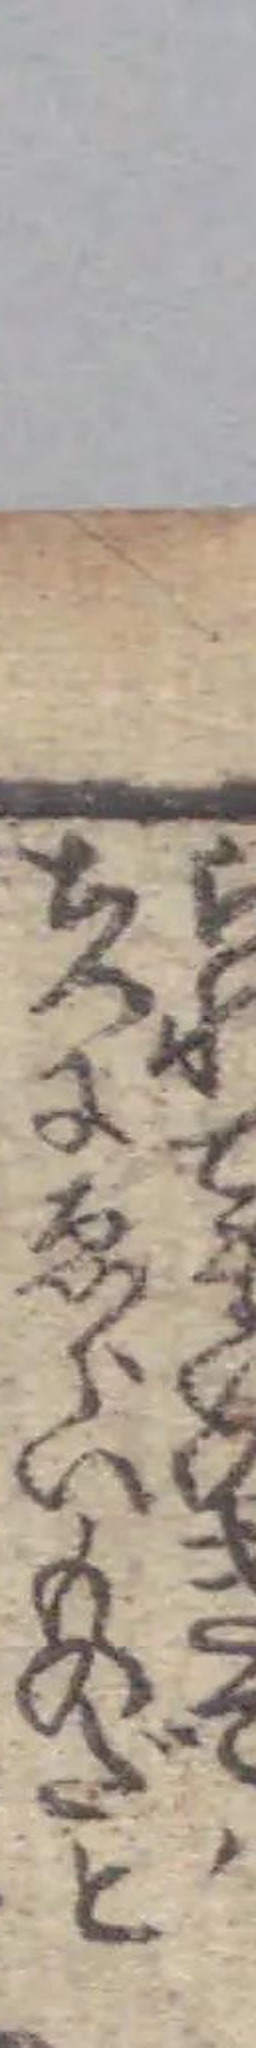ちつにゑらいものだと
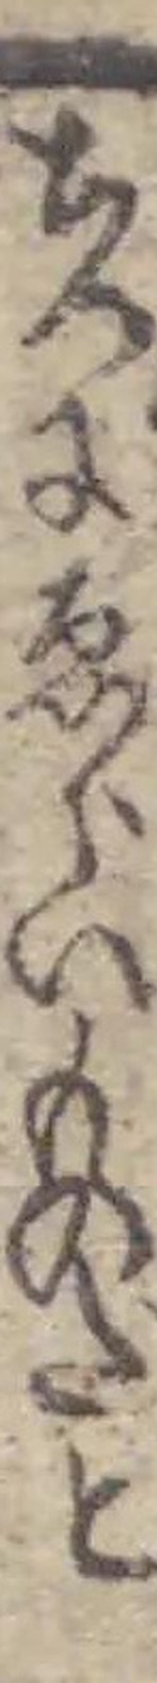ちつにゑらいものだと
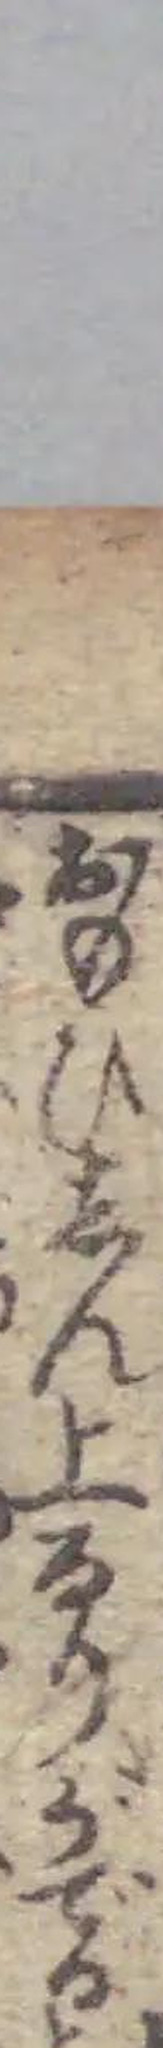おもひしん上るりがでると
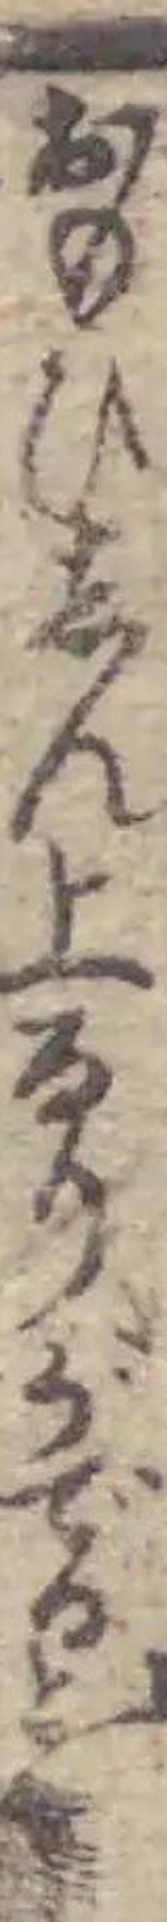おもひしん上るりがでると
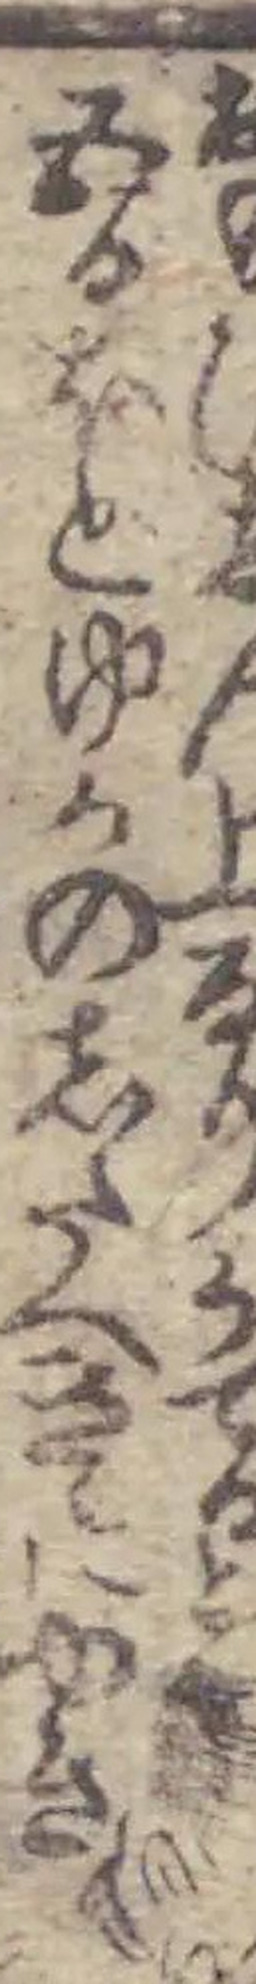五日ほどゆかのしたへきゝにゆき
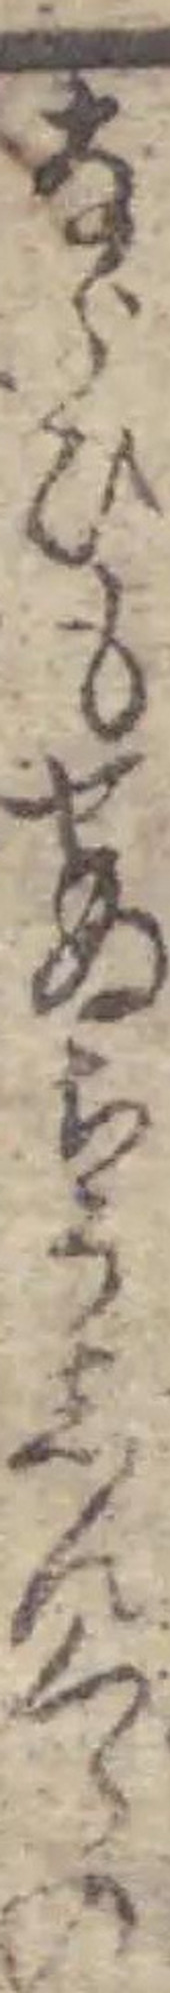ならひもせぬちうしんくらの
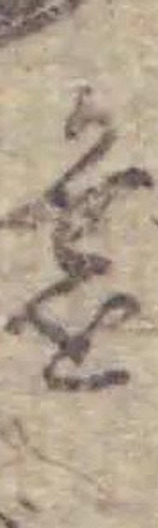かぜを
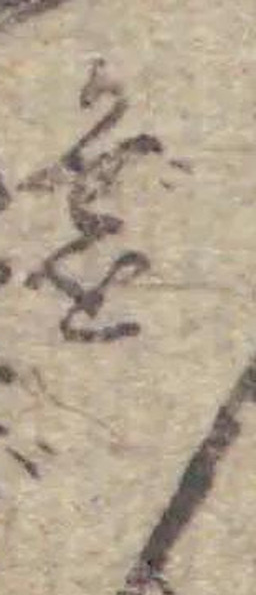かぜを
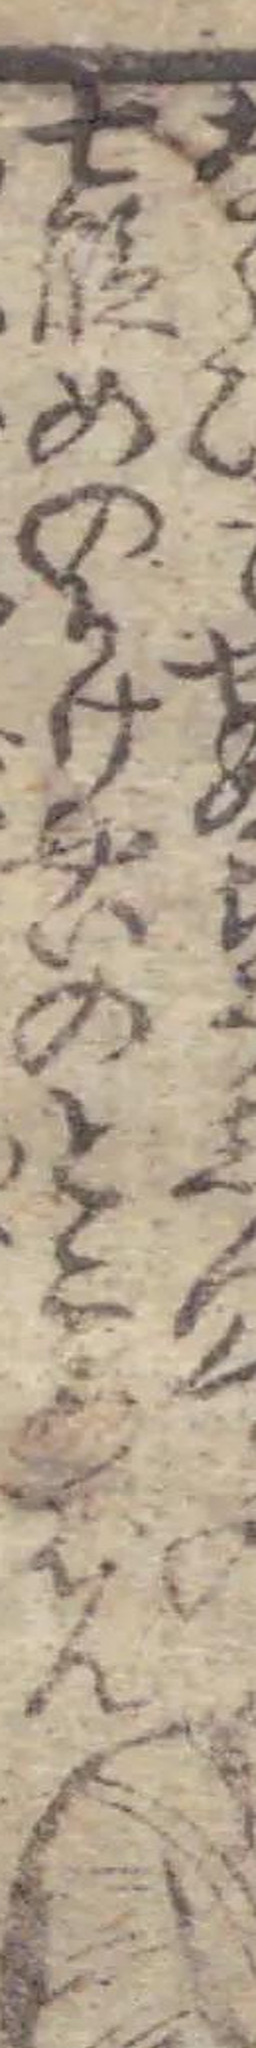七段めのかけやいのとこはん
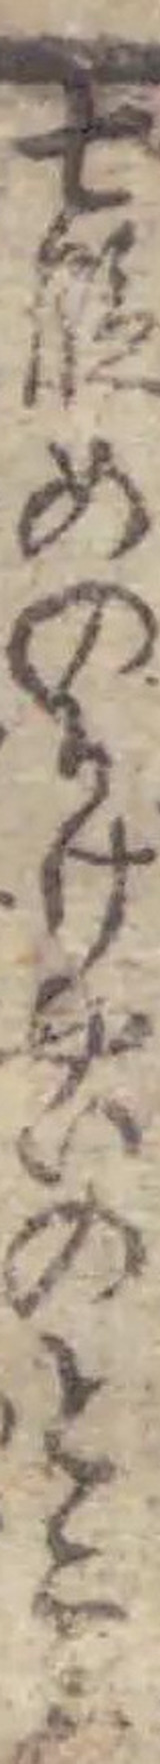七段めのかけやいのとこはん
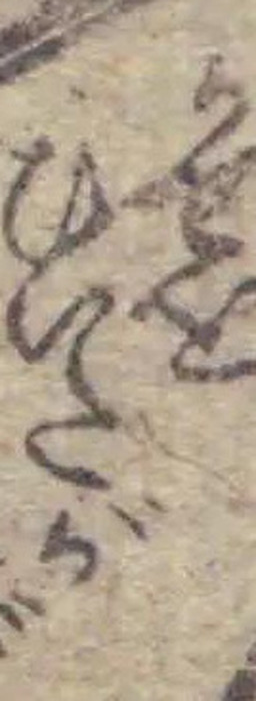ひいたが
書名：津以曽無弟の甚六 3巻
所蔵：国立国会図書館 National Diet Library, JAPAN
